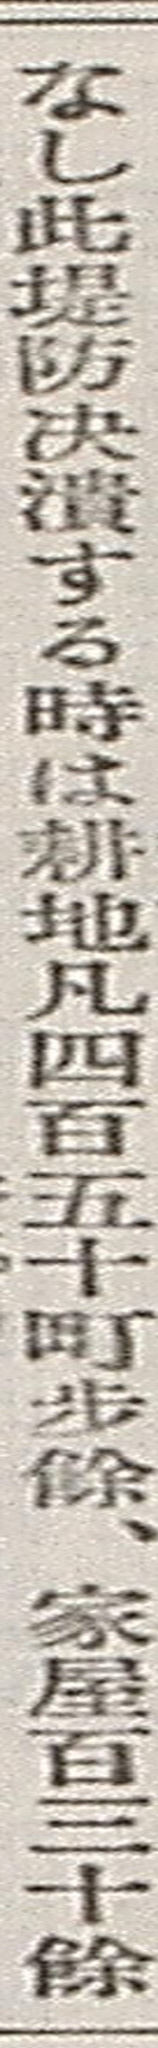なし此堤防决潰する時は耕地凡四百五十町歩餘、家屋百三十餘
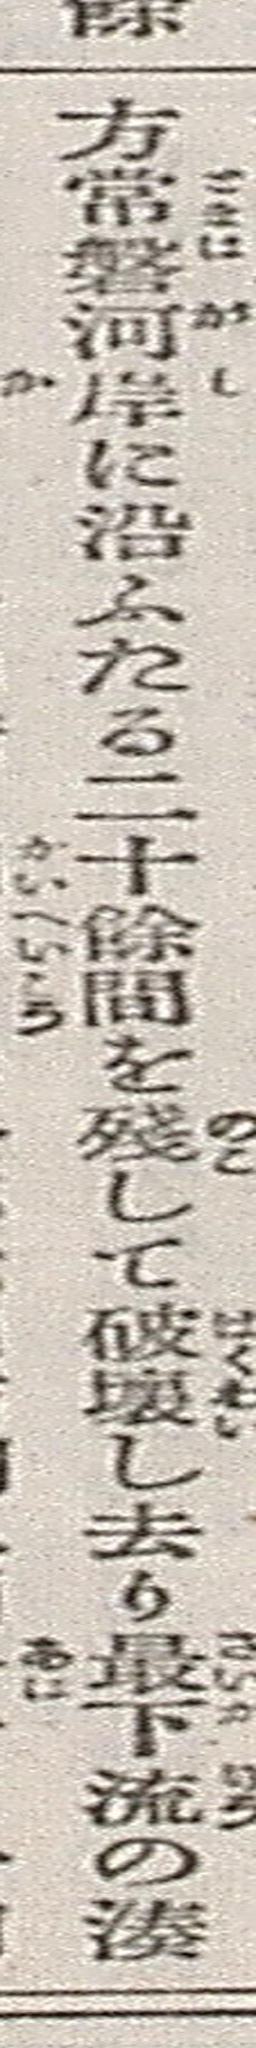方常盤河岸に沿ふたる二十間餘を残して破壊し去り最下流の湊
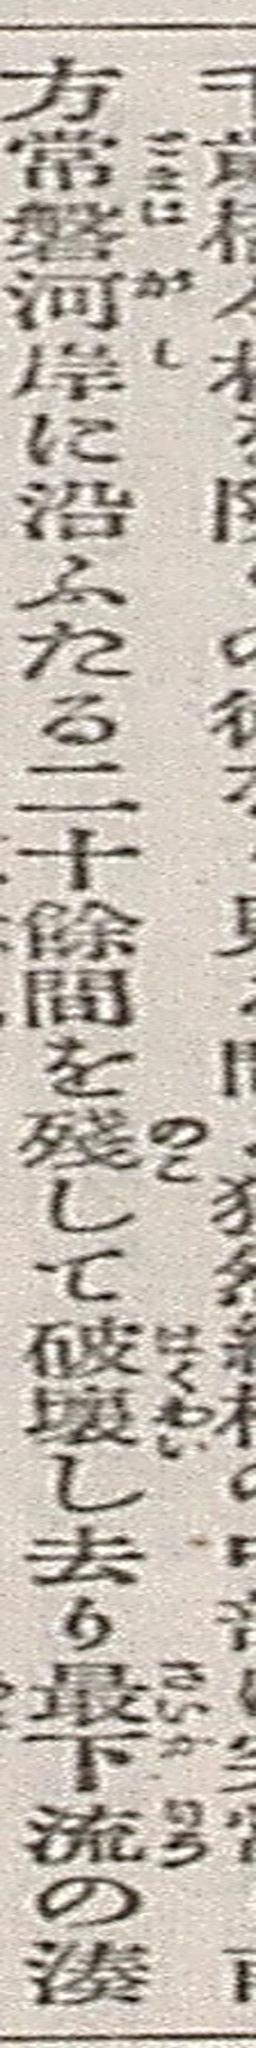方常盤河岸に沿ふたる二十間餘を残して破壊し去り最下流の湊
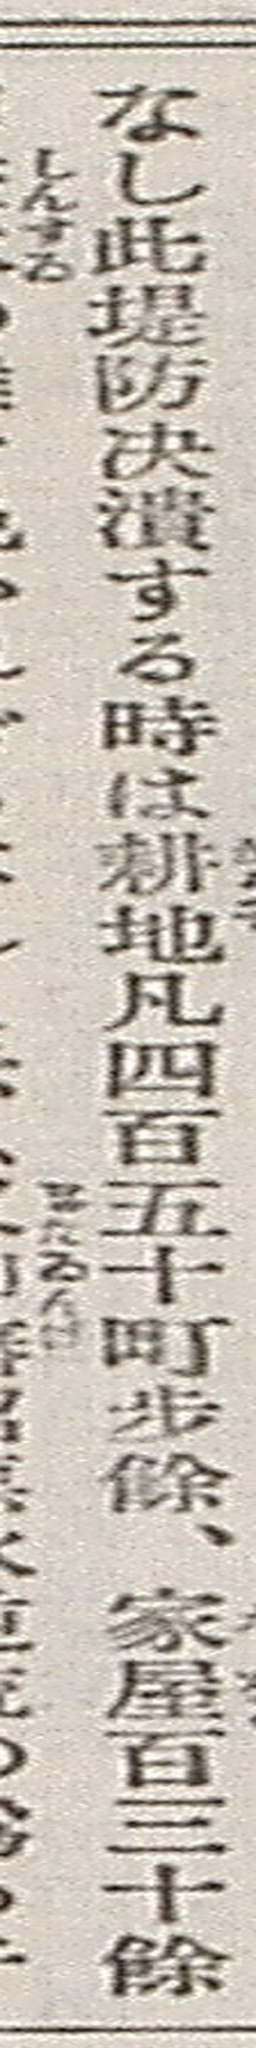なし此堤防决潰する時は耕地凡四百五十町歩餘、家屋百三十餘
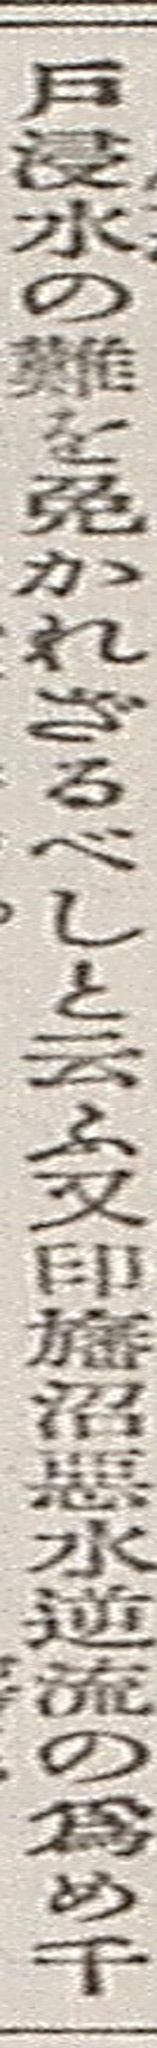戸浸水の難を免かれざるべしと云ふ又印旛沼悪水逆流の為め千
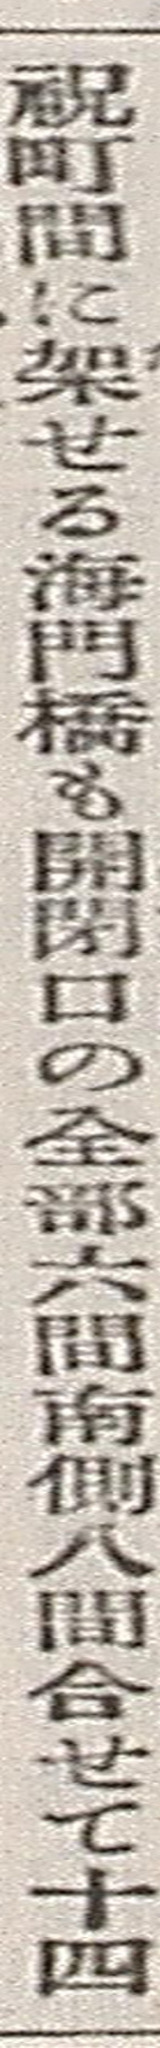祝町間に架せる海門橋も開閉口の前部六間難側八間合せて十四
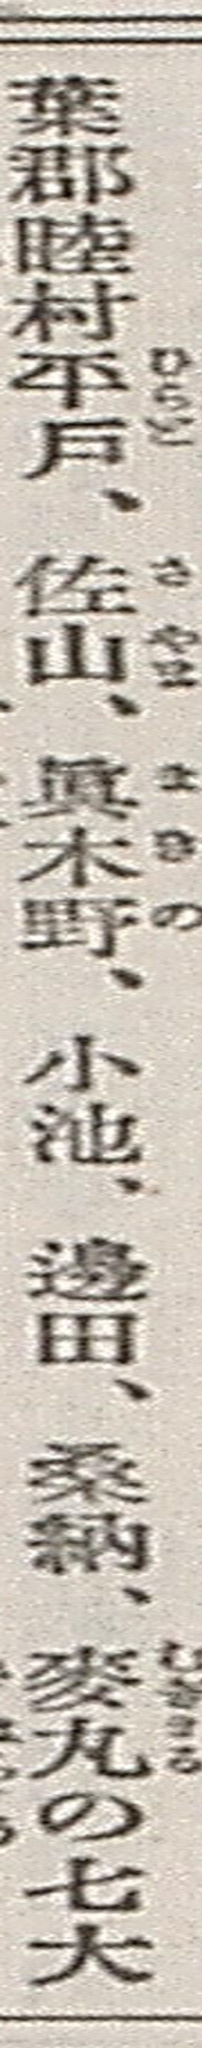葉郡睦村平戸、佐山、真木野、小池、辺田、桑納、麦丸の七大
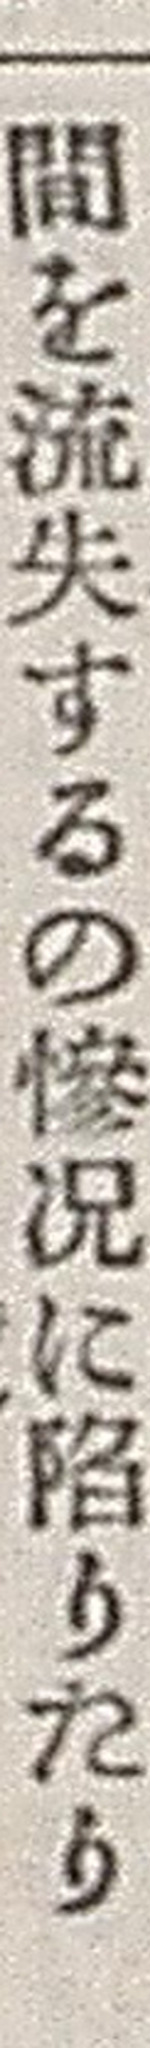間を流失するの惨況に陥りたり
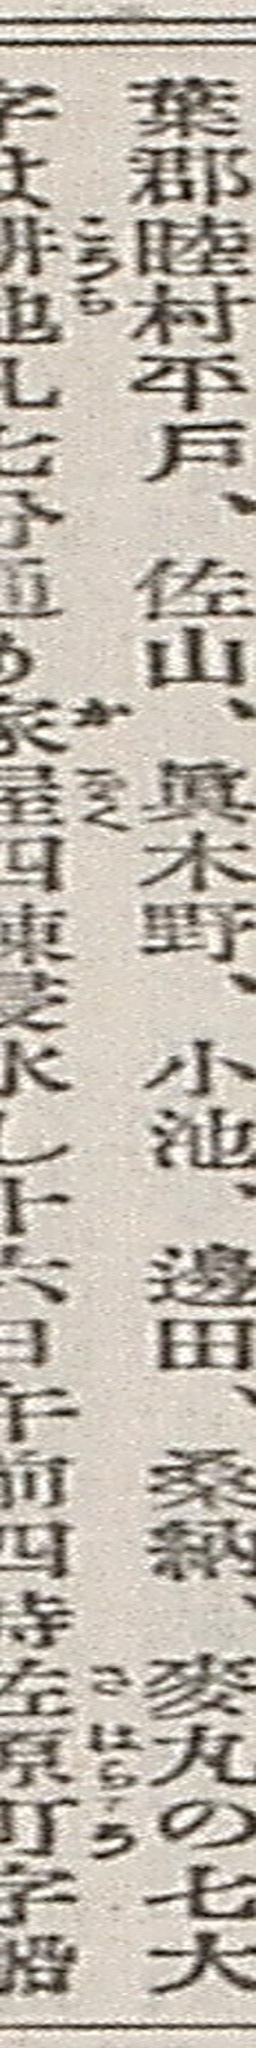字は耕地凡七分通り家屋四棟浸水し十六日午前四時佐原町字船
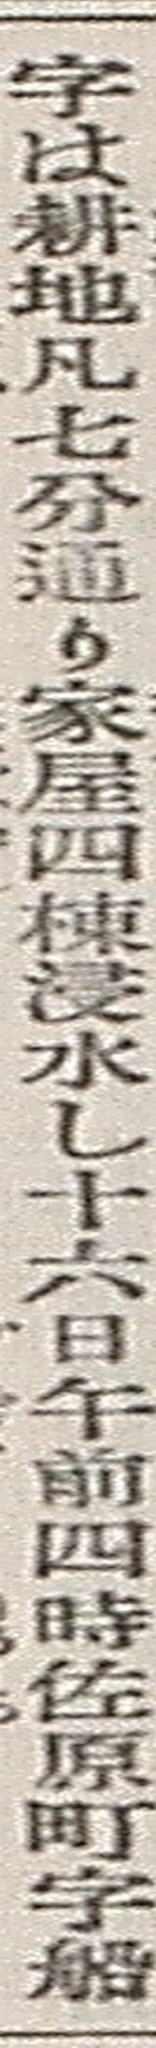字は耕地凡七分通り家屋四棟浸水し十六日午前四時佐原町字船
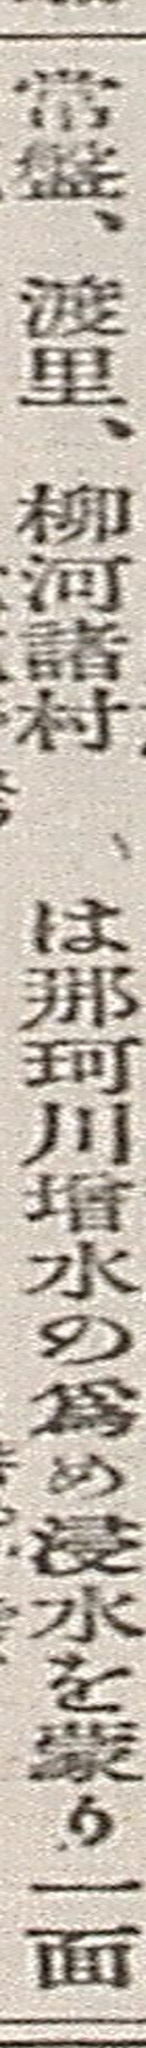常盤、渡里、栁河諸村は那珂川増水の為め浸水を蒙り一面
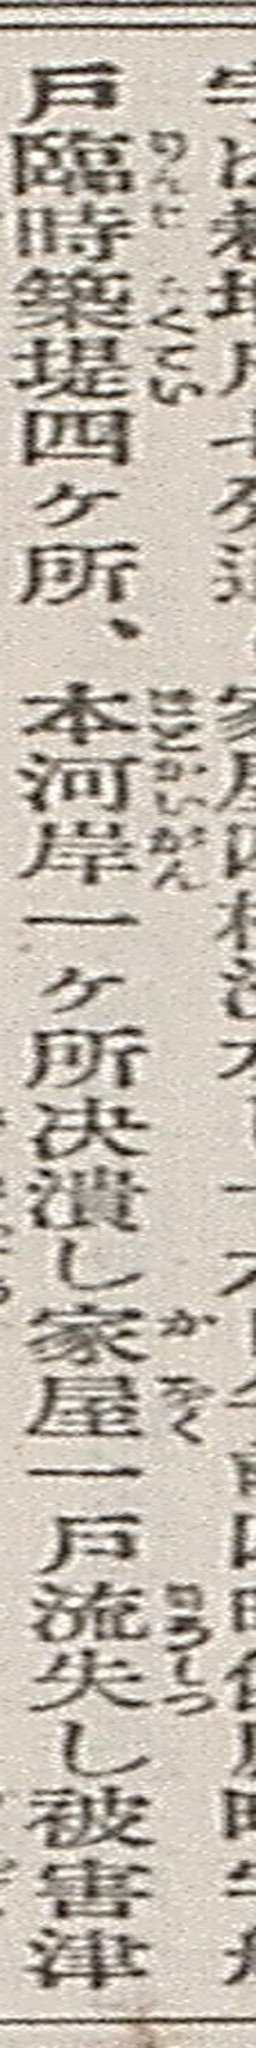戸臨時築提四ヶ所、本河岸一ヶ所决潰し家屋一戸流失し被害津」
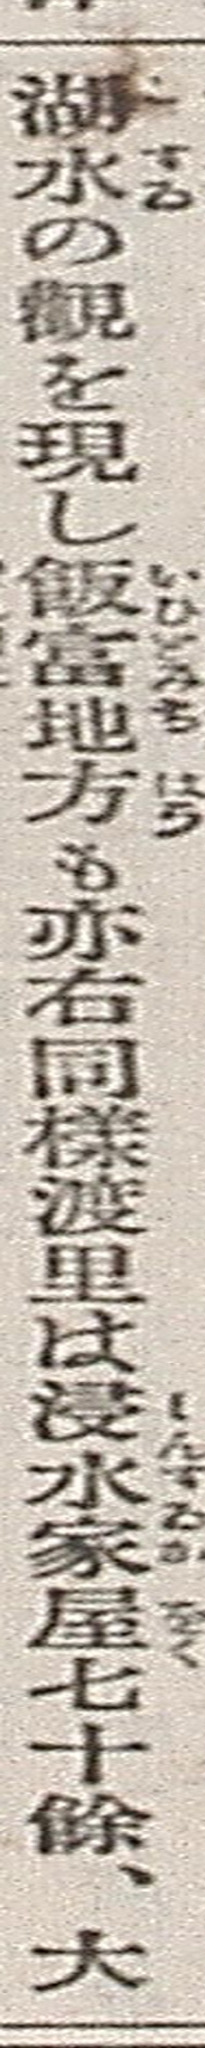湖水の観を現し飯富地方も亦右同様渡里は浸水家屋七十餘、大
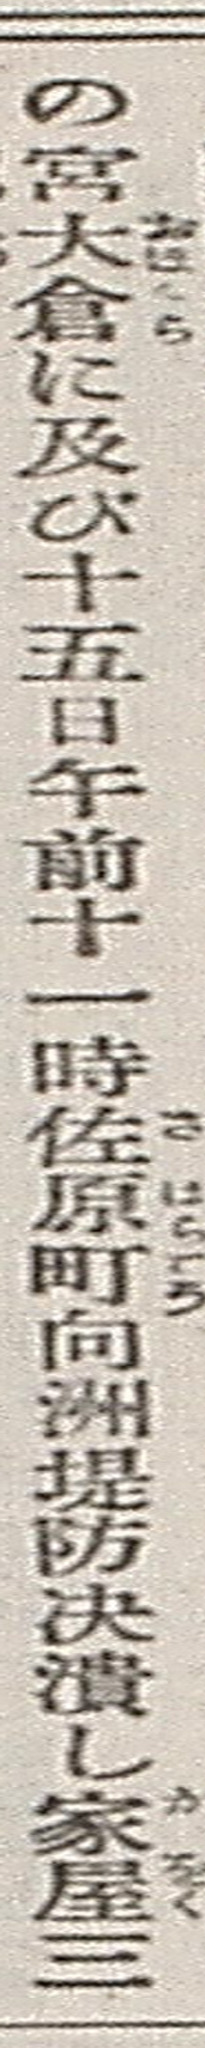の宮大倉に及び十五日午前十一時佐原町向洲堤防决潰し家屋三
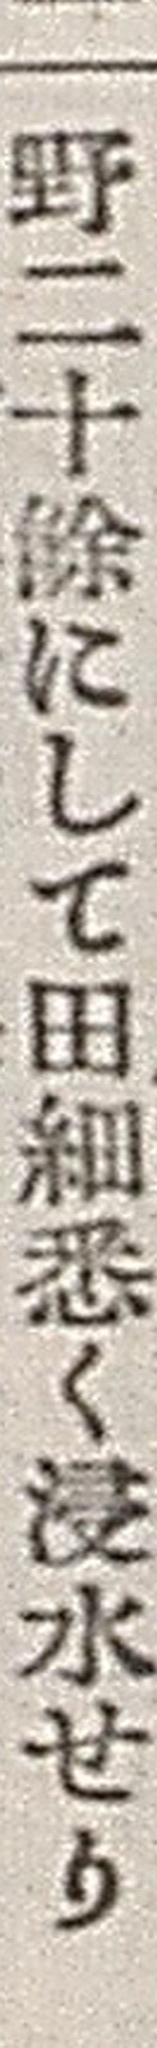野二十餘にして田細悉く浸水せり
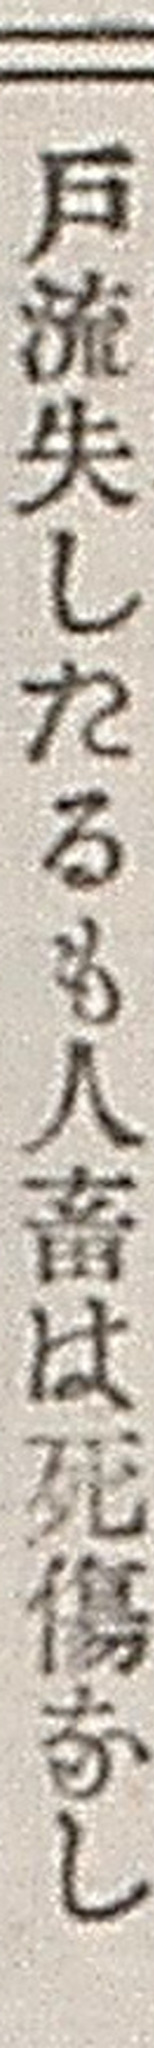戸流失したるも人畜は死傷なし
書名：風俗畫報臨時増刊第百二十八號　洪水被害録（下）
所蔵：東京大学地震研究所図書室 Earthquake Research Institute Library, The University of Tokyo, JAPAN
